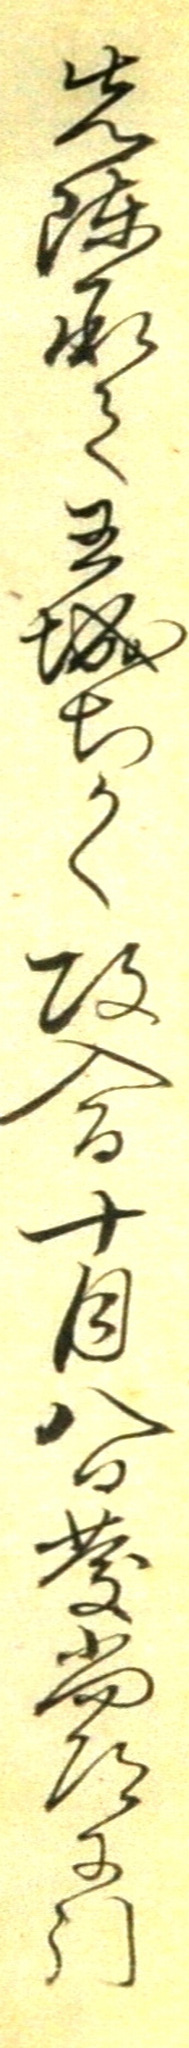先陣承て王城ちかく攻入る十月八日慶尚道に引
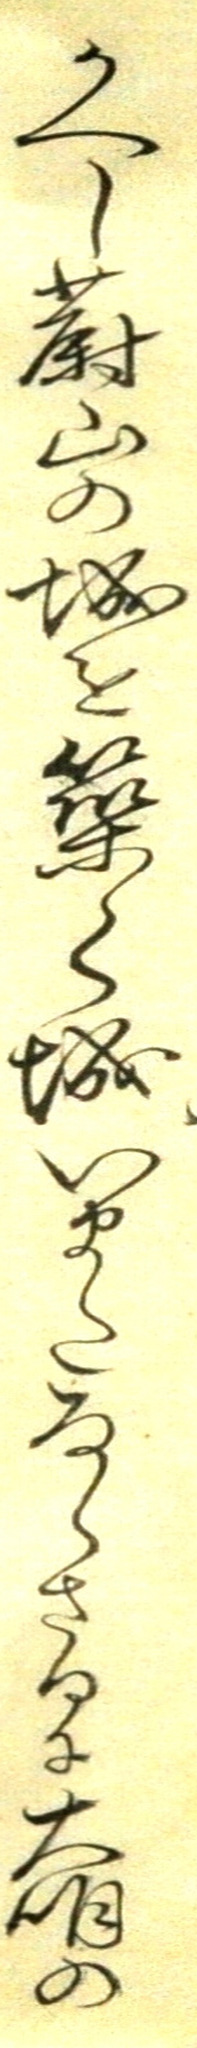かへし蔚山の城を築く城いまたならさるに大明の
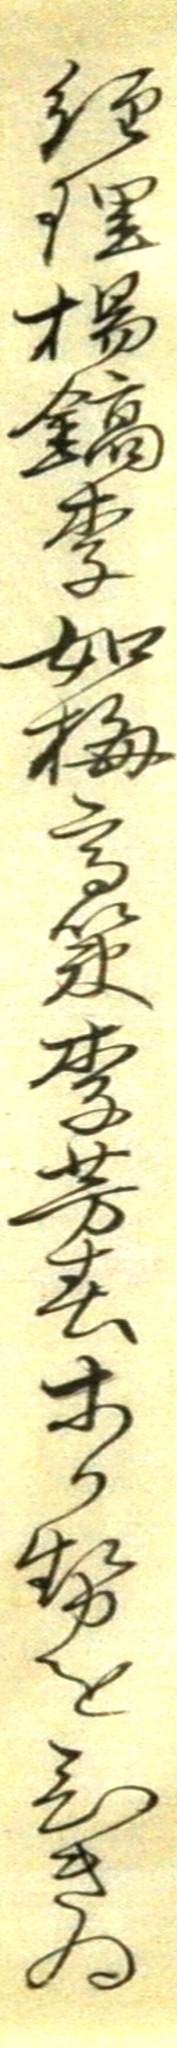経理揚鎬李如梅高策李芳春等か勢をひきゐ
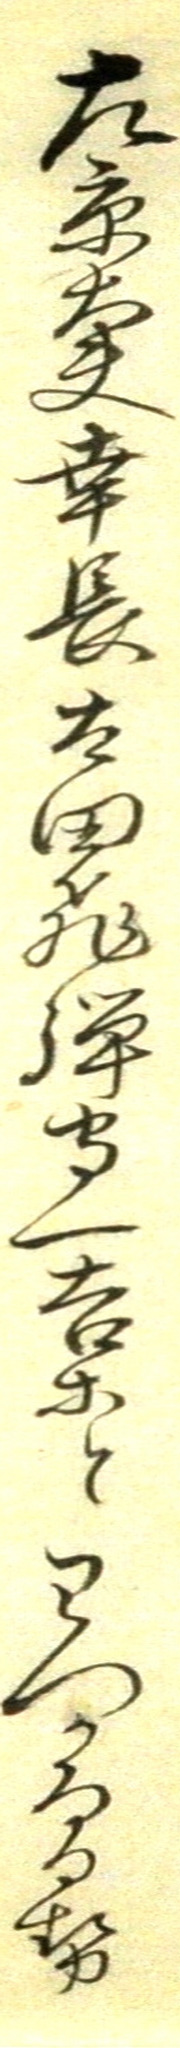左京太夫幸長太田飛騨守一吉等とわつかなる勢
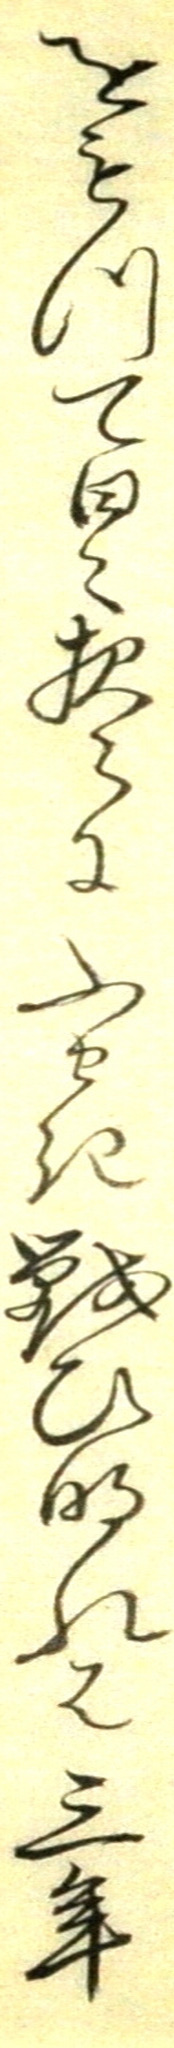をもつて日々夜々にふせき戦ひ明れは三年
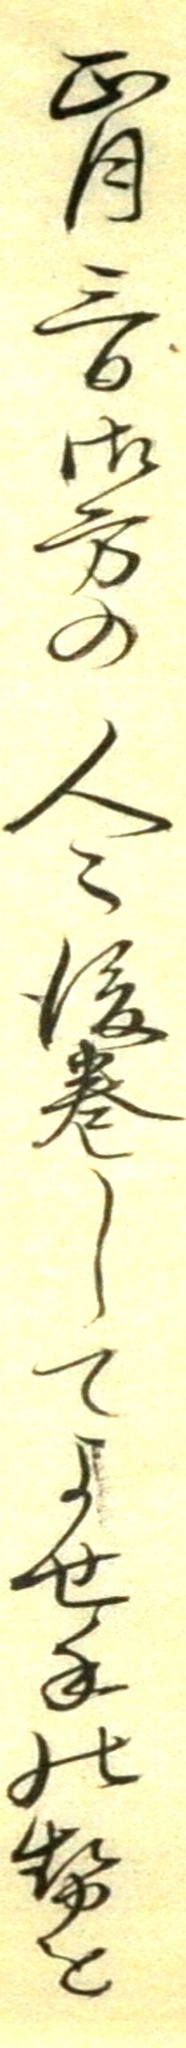正月三日御方の人々後巻してよせ手の勢を
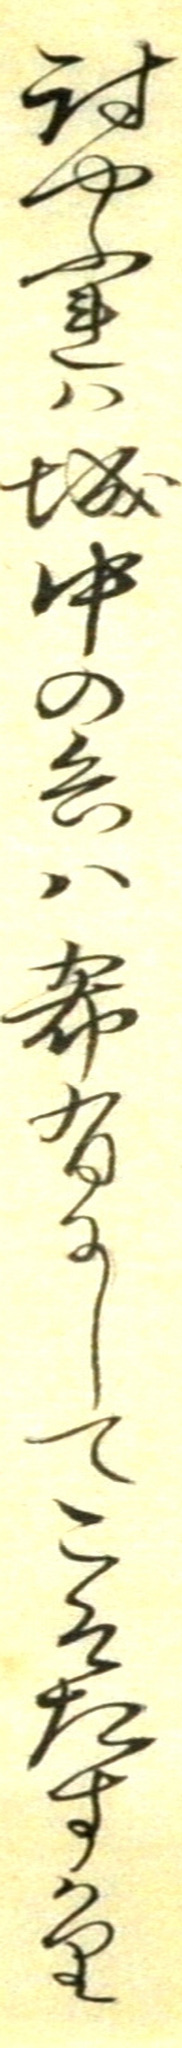討やふれは城中の兵は希有にしてこそたすかり
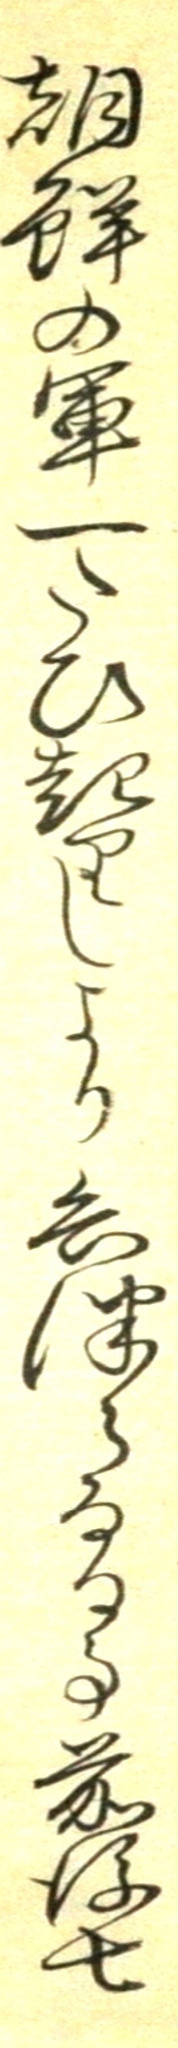朝鮮の軍一たひ起りしより兵つらなる事前後七
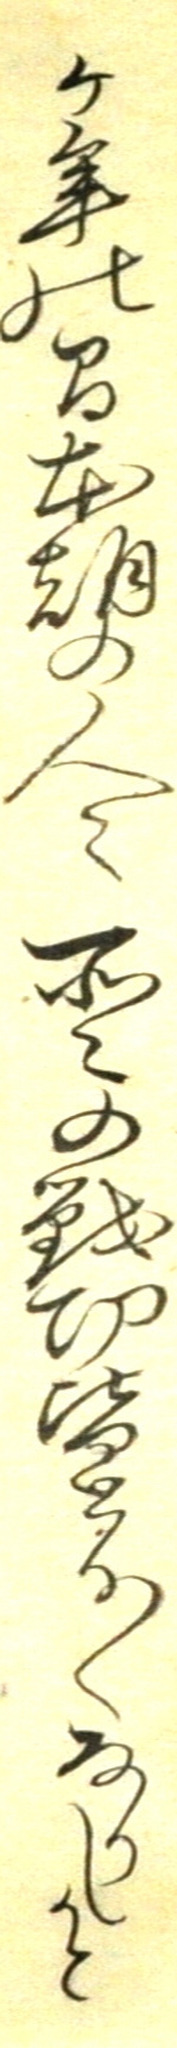ヶ年の間本朝の人々所々の戦功皆とほくなりしかと
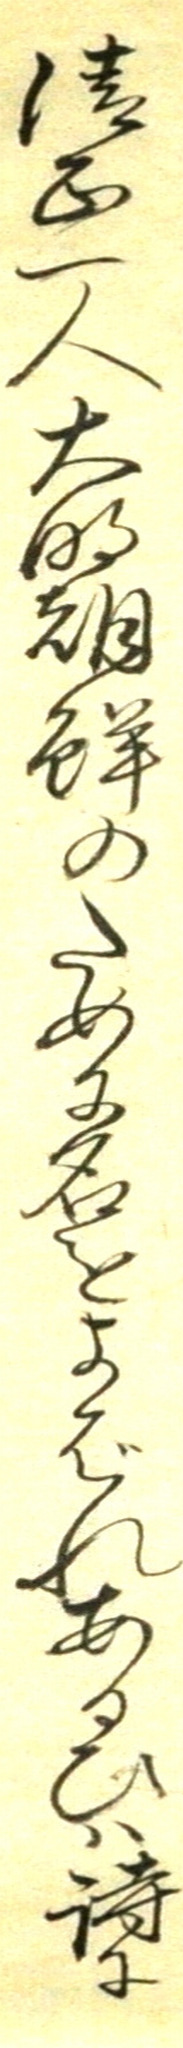清正一人大明朝鮮のために名をよばれあるひは詩に
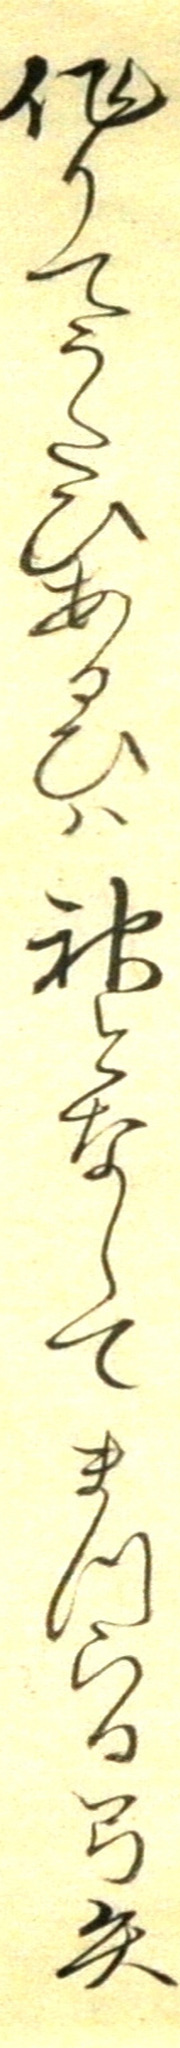作りてうたひあるひは神となしてまつらる弓矢
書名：藩翰譜（十二・上）
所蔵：伊那市立高遠町図書館・合同会社AMANE
